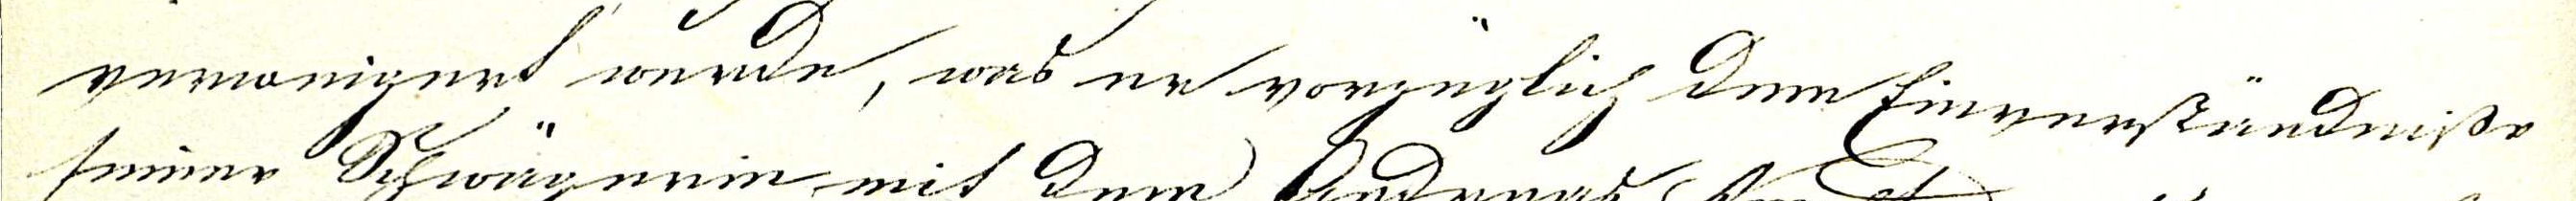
verweigert wurde, was er vorzüglich dem Einverständnis
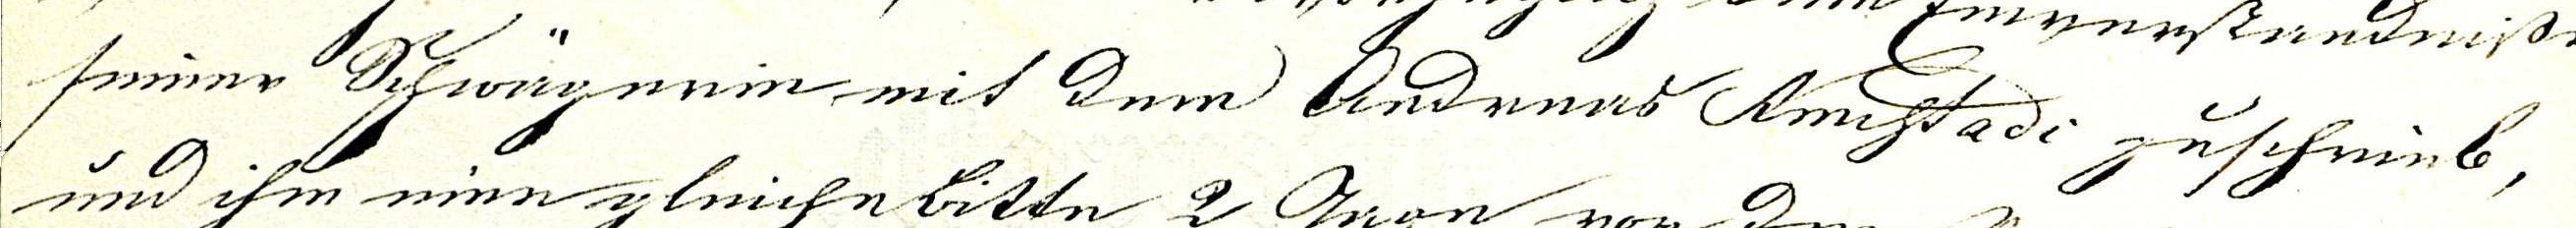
seiner Schwägerin mit dem Andreas Amihtadi zuschrieb,
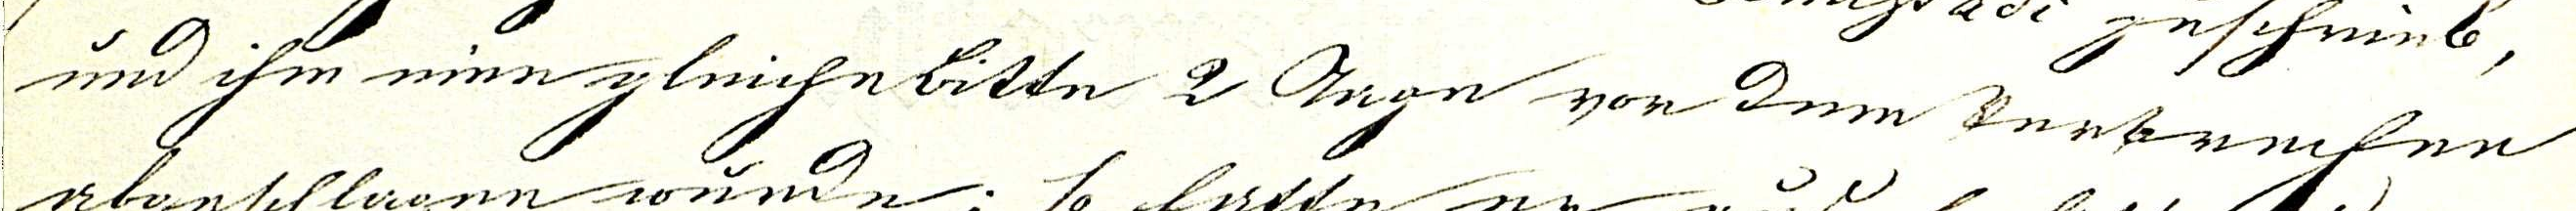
und ihm eine gleiche Bitte 2 Tage vor dem Verbrechen
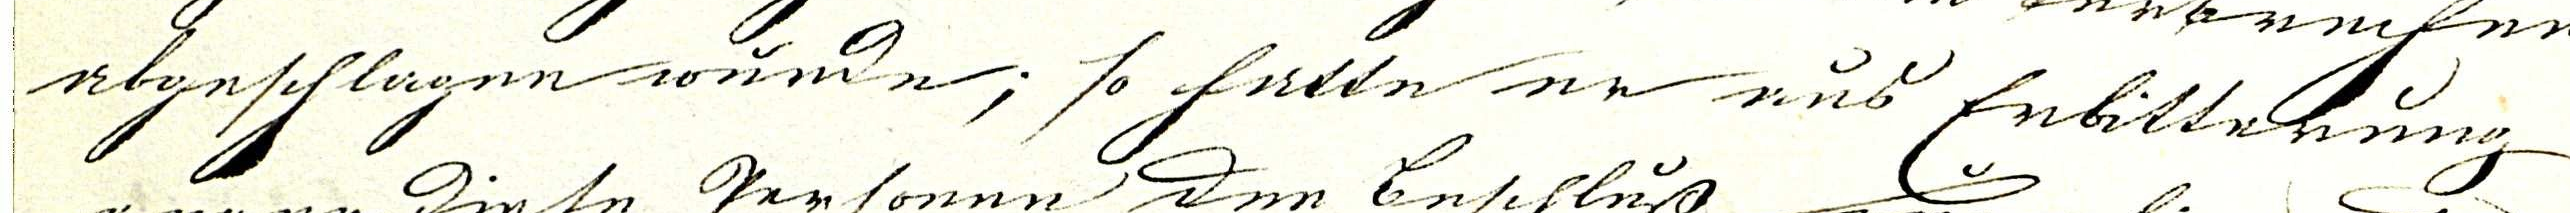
abgeschlagen wurde; so hatte er aus Erbitterung
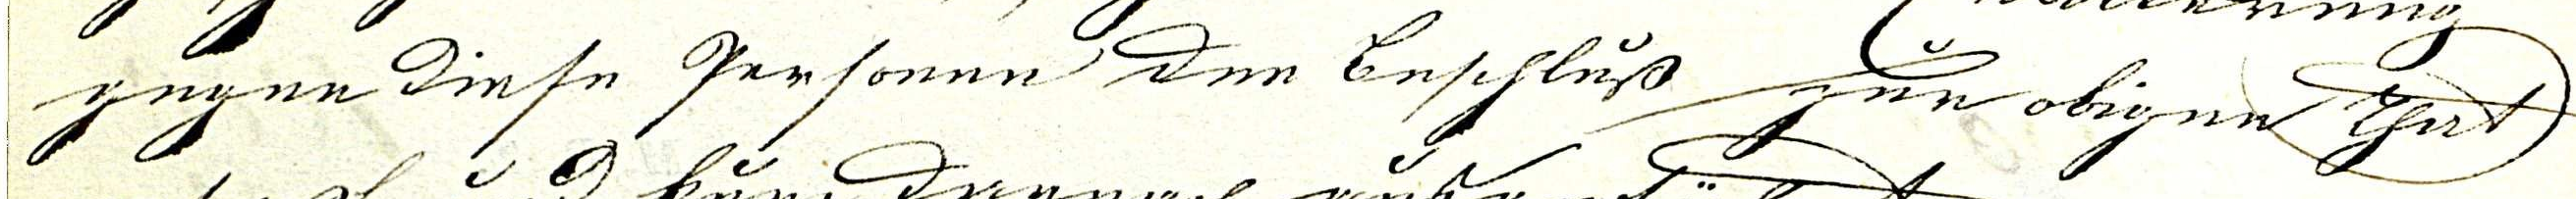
gegen diese Personen den Beschluß zur obigen That
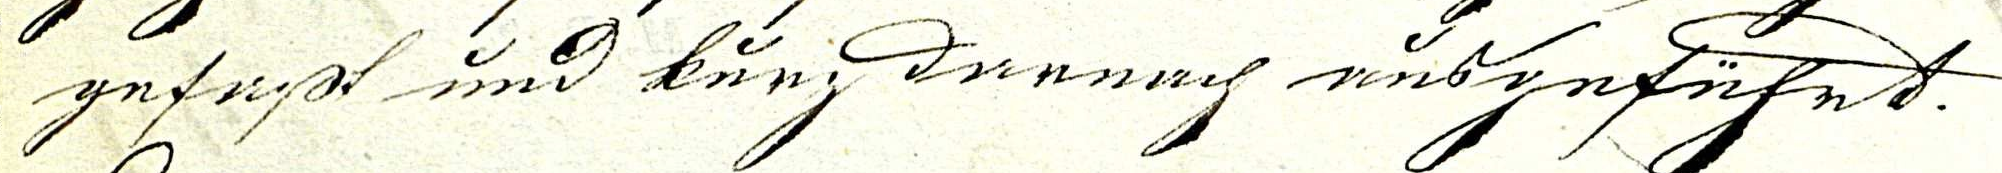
gefaßt und kurz darnach ausgeführt.
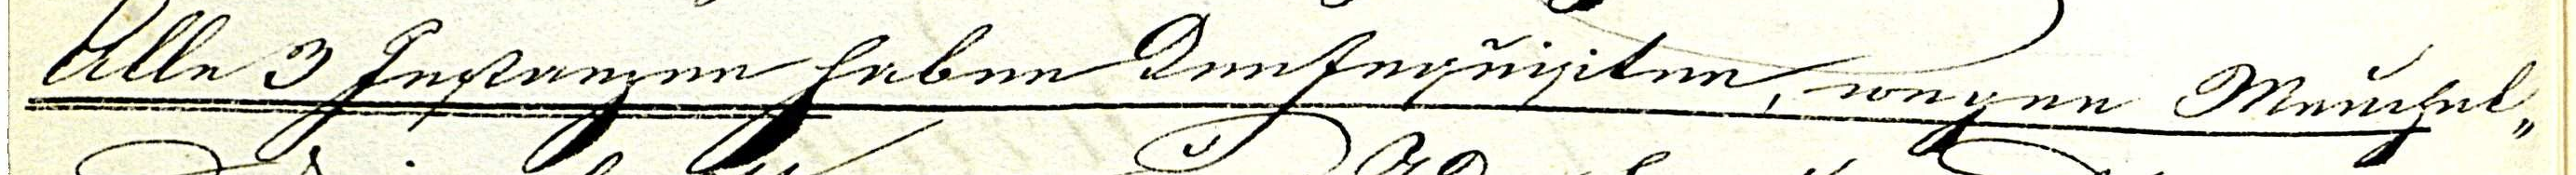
Alle 3 Instanzen haben den Inquisiten, wegen Meuchel¬
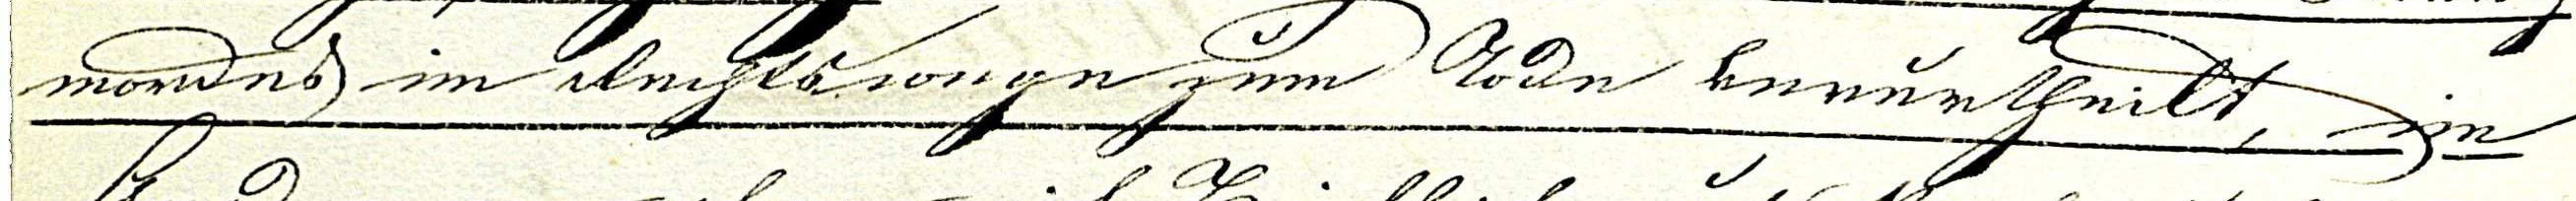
mordes im Rechtswege zum Todee verurtheilt, in
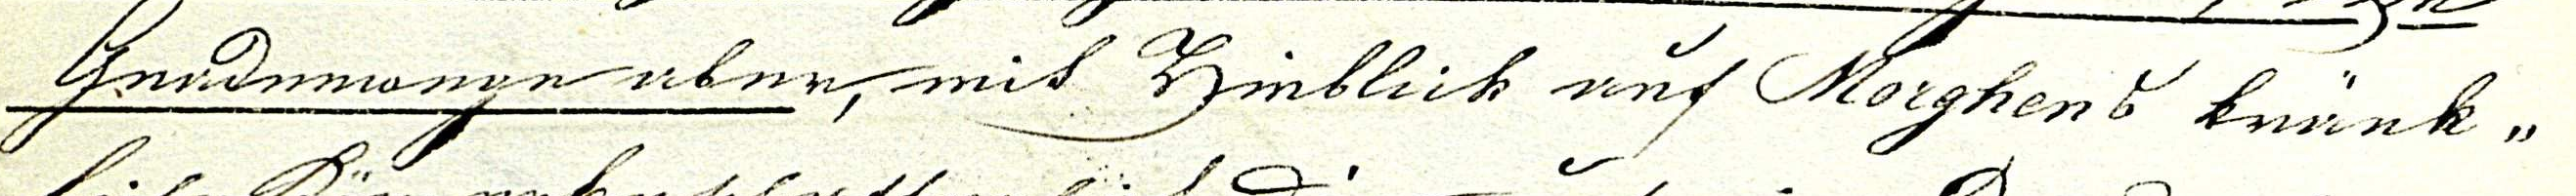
Gnadewege aber, mit Hinblick auf Morghens kränk¬
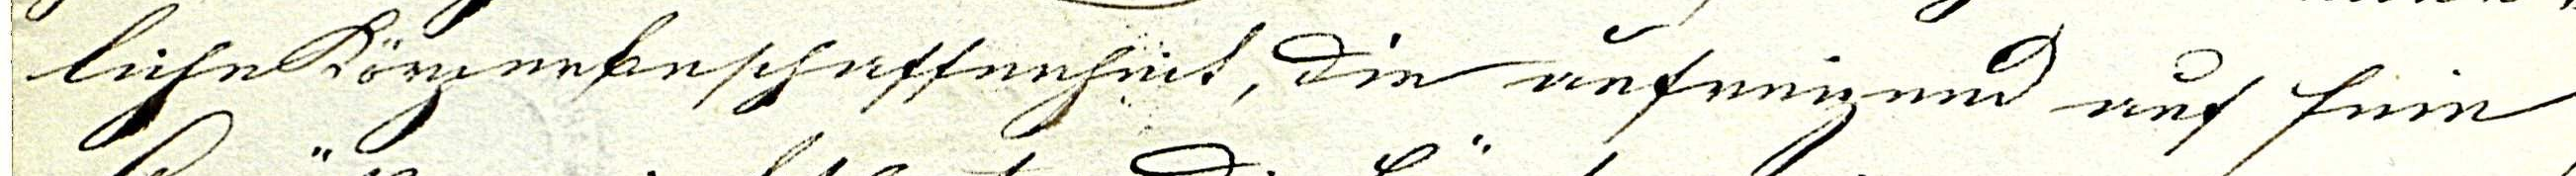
liche Körperbeschaffenheit, die aufreizend auf sein
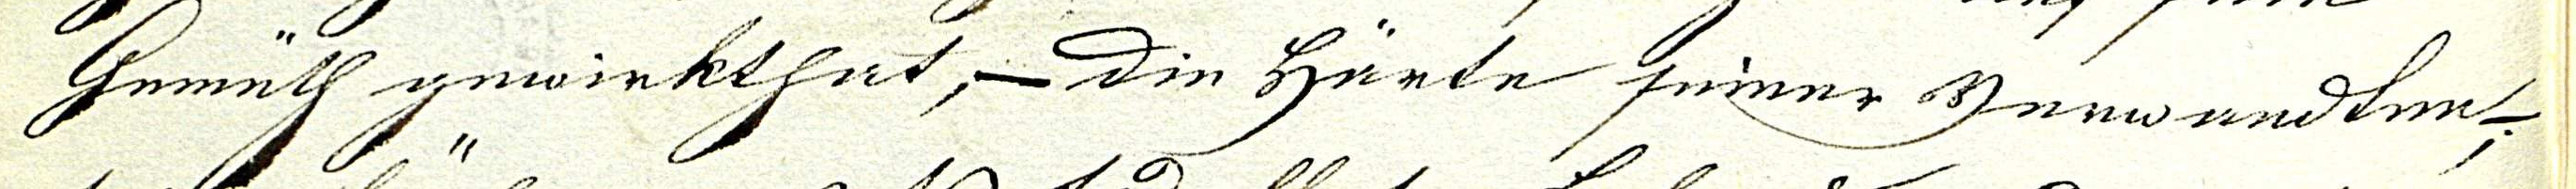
Gemüth gewirkt hat, - die Härte seiner Verwandten,
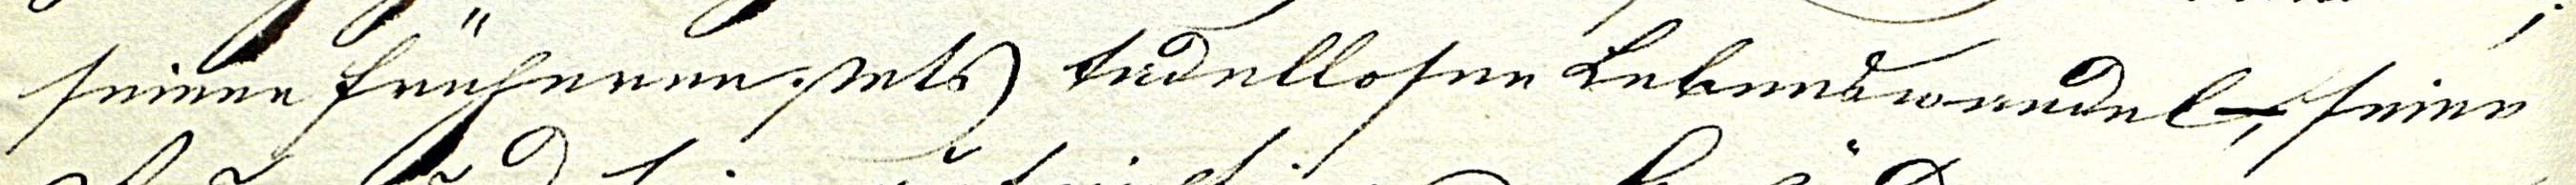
seinen früheren stets tadellosen Lebenswandel --, seine
